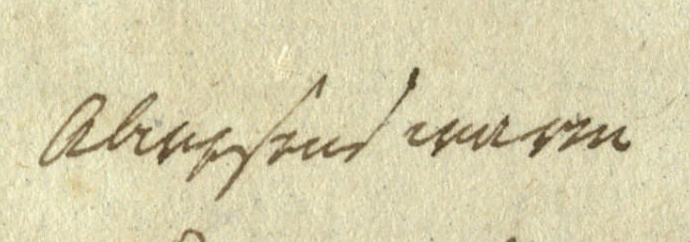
Abwesend waren
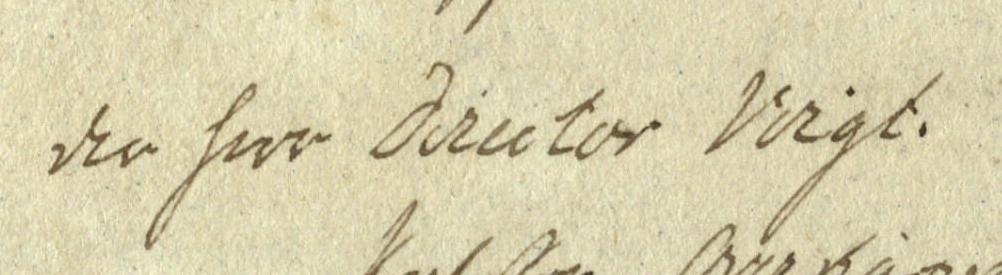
der Herr Director Voigt.
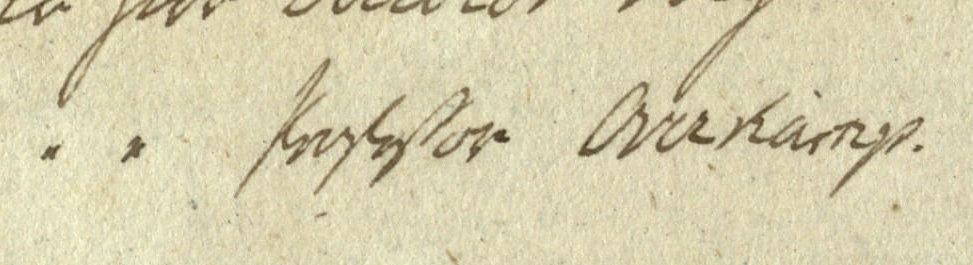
Professor Overkamp.
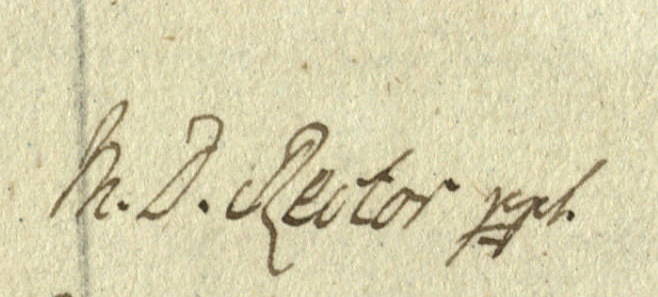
M. D. Rector ppt.
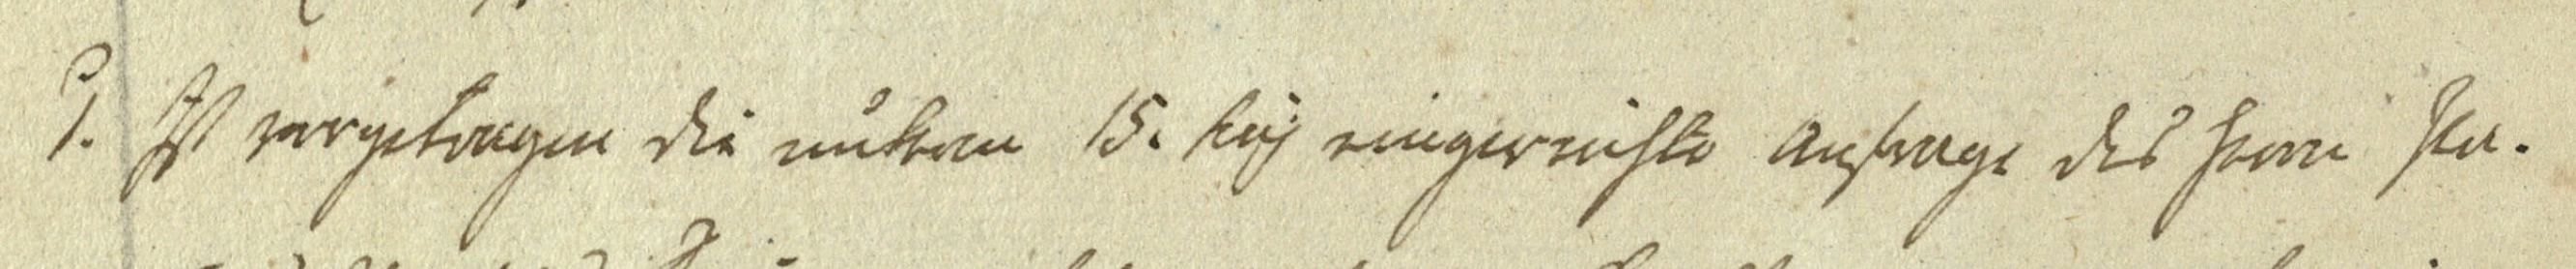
1. Ist vorgetragen die unterm 15. huj eingereichte Anfrage des Herrn Pa¬
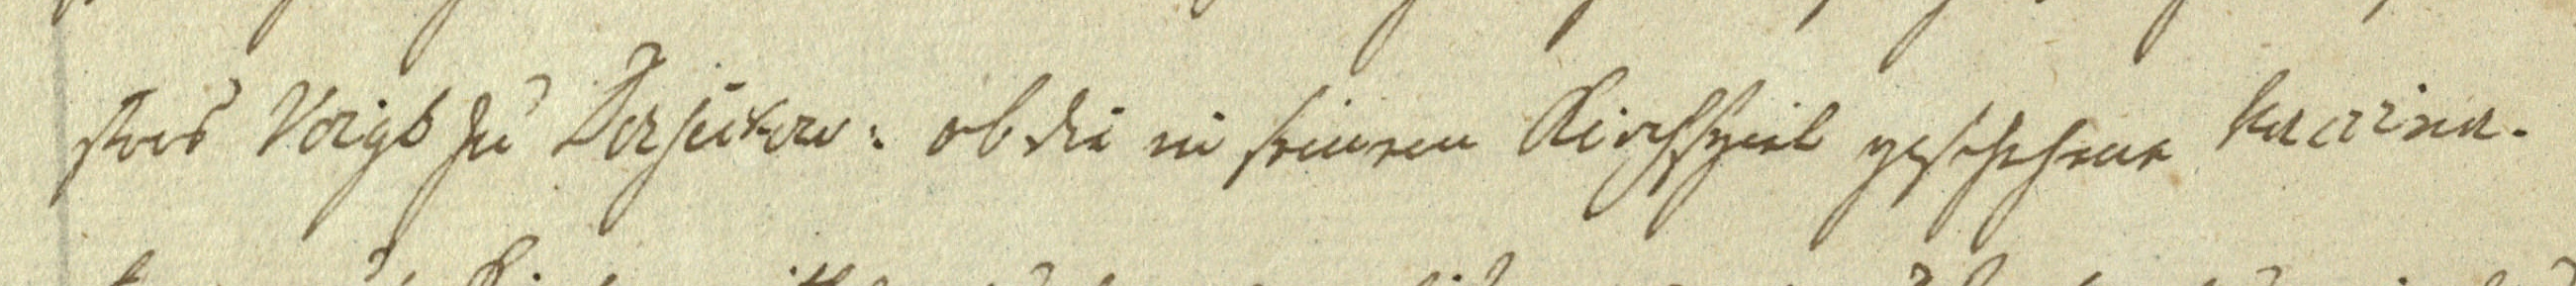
stors Voigt zu Derseckow: ob die in seinem Kirchspiel geschehene Vaccina¬
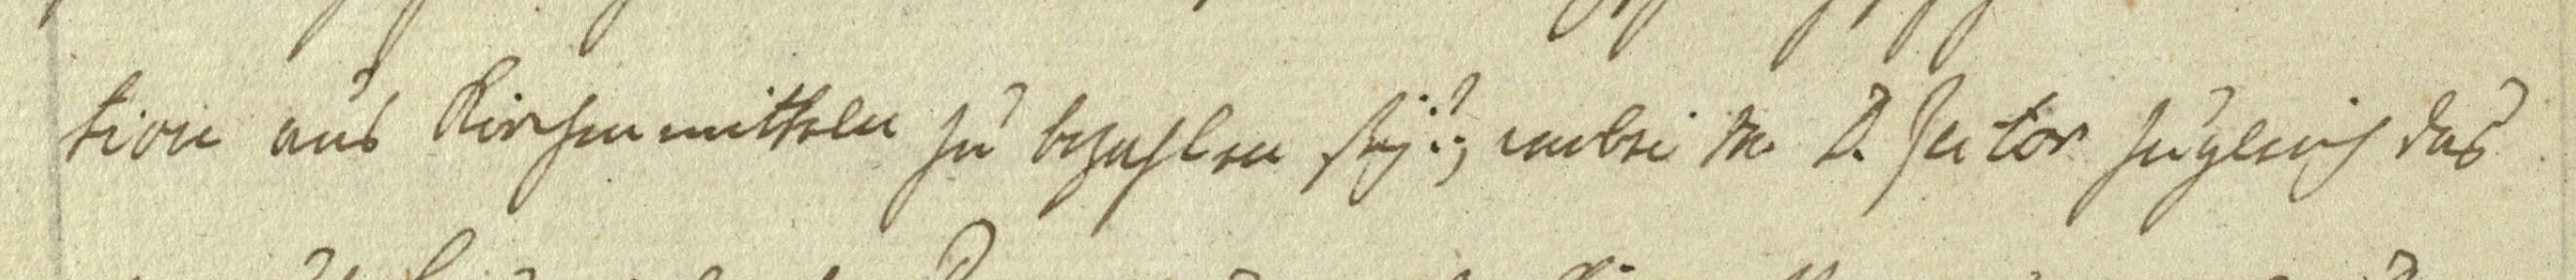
tion aus Kirchenmitteln zu bezahlen seÿ?, wobei M. D. Rector zugleich das
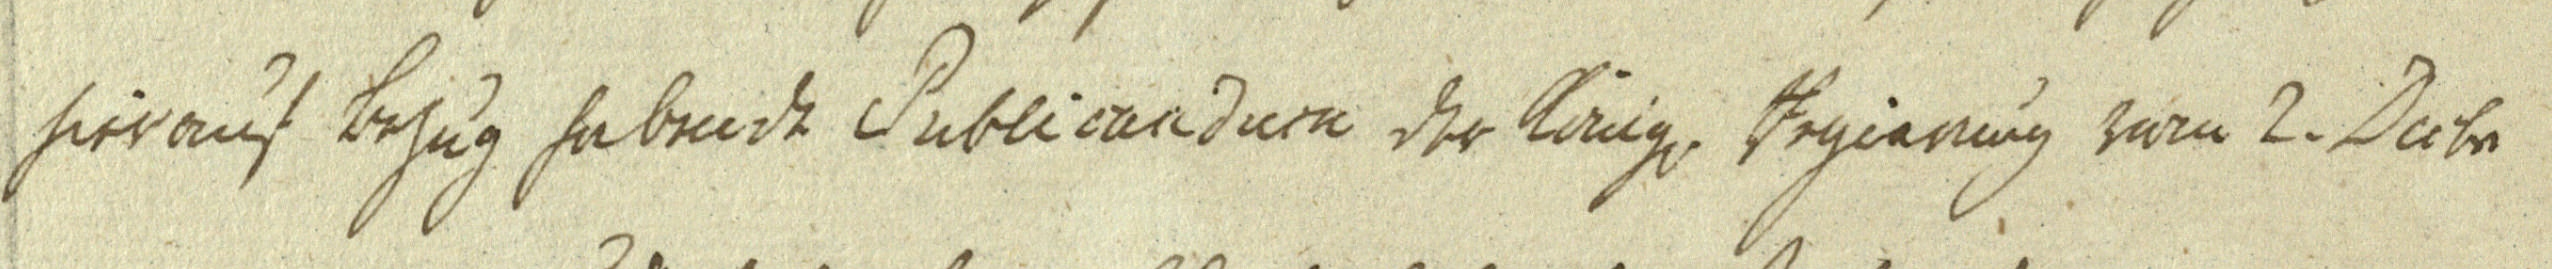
hierauf Bezug habende Publicandum der Königl. Regierung vom 2. Decbr
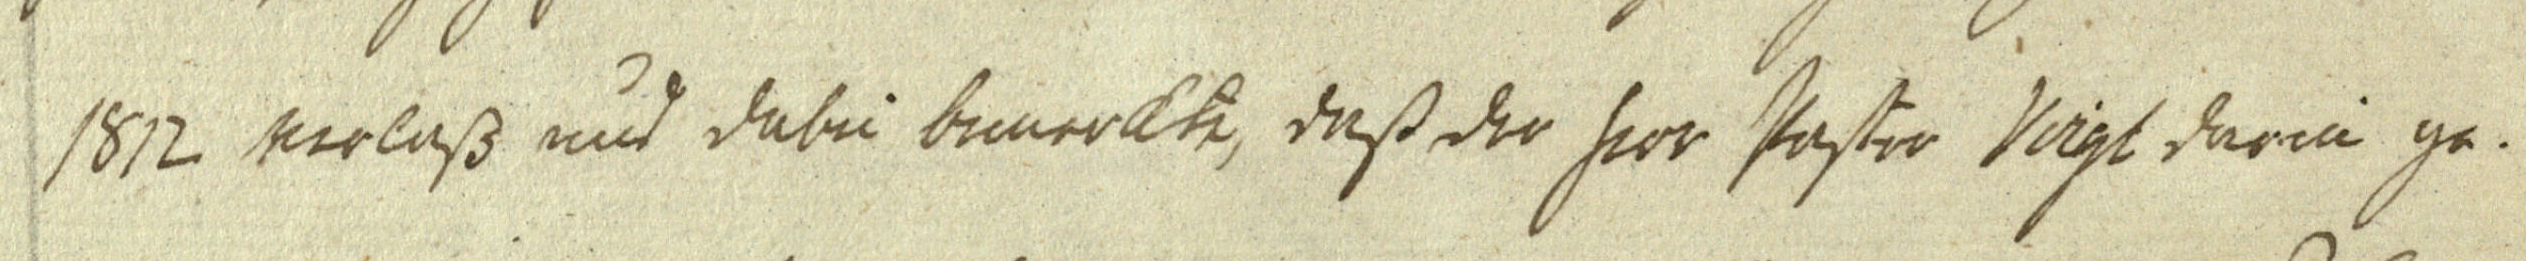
1812 verlaß und dabei bemerkte, daß der Herr Pastor Voigt darin ge¬
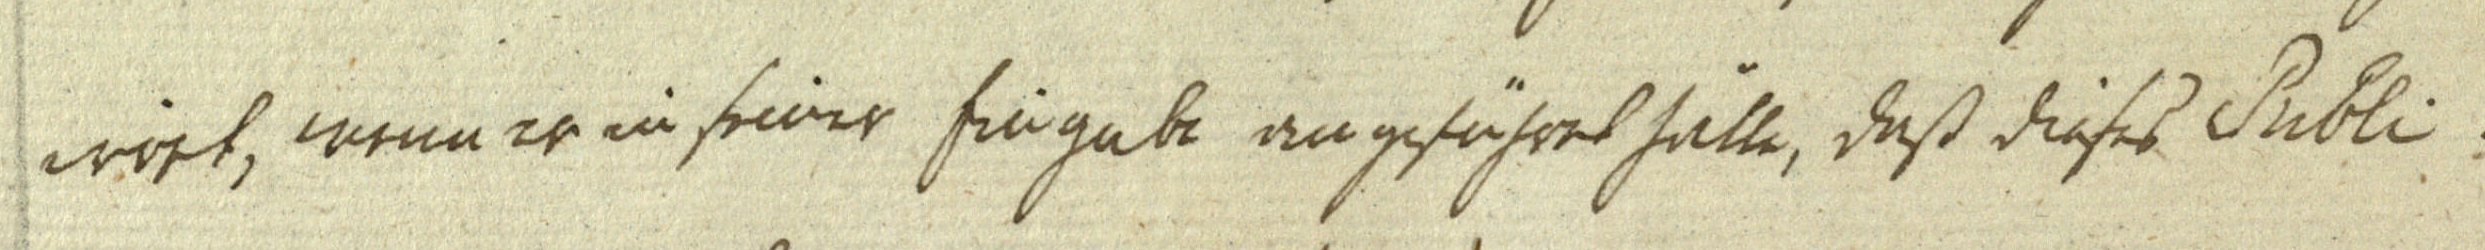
irret, wenn er in seiner Eingabe angeführet hätte, daß dieses Publi¬
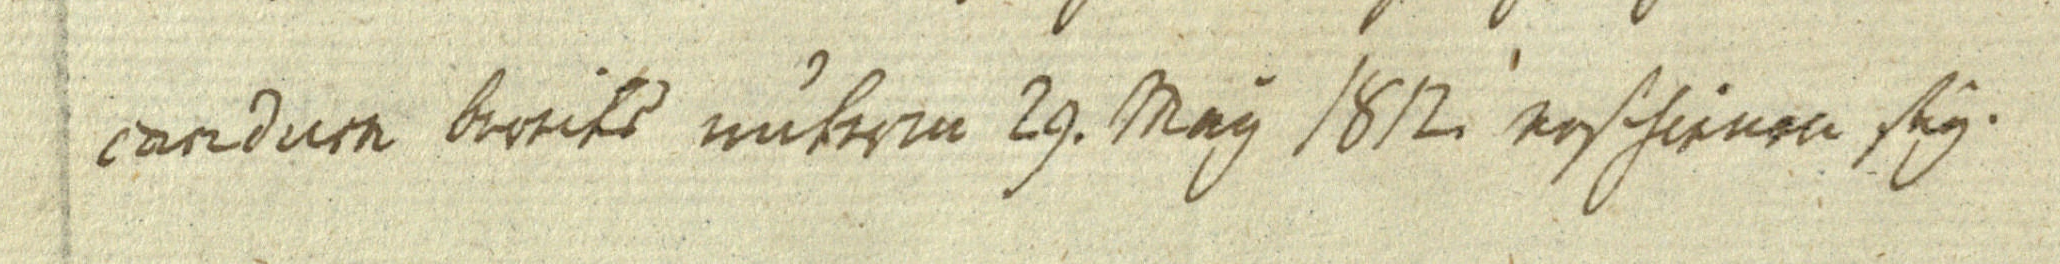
candum bereits unterm 29. Maÿ 1812 erschienen seÿ.
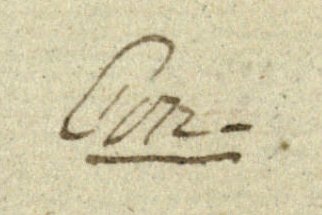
Con¬
